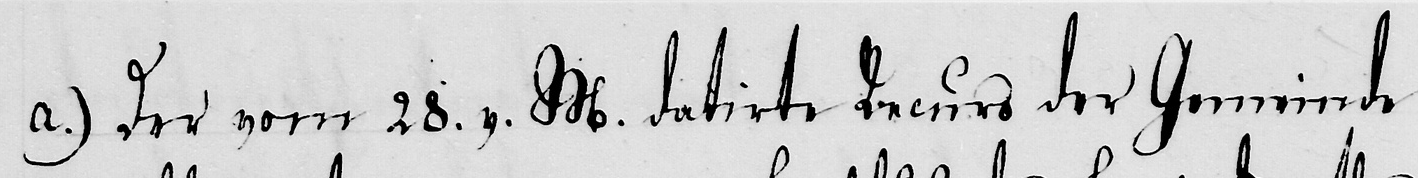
a.) Der vom 28. v. M. datirte Recurs der Gemeinde
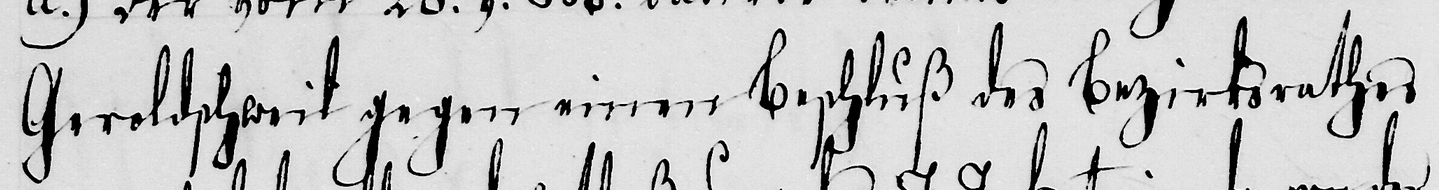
Geroldschweil gegen einen Beschluß des Bezirksrathes
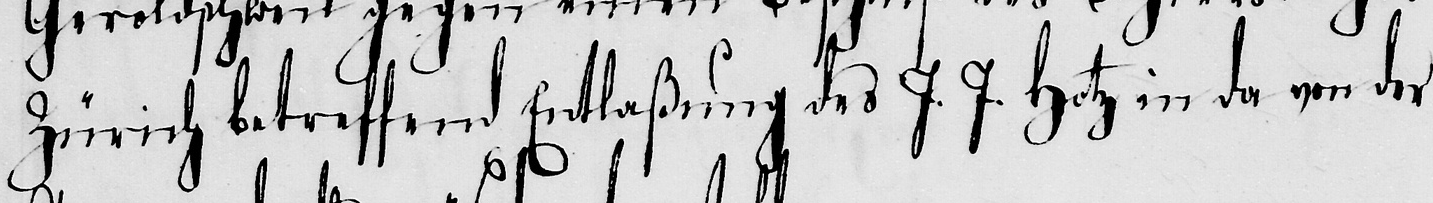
Zürich betreffend Entlaßung des J. J. Hotz in da von der
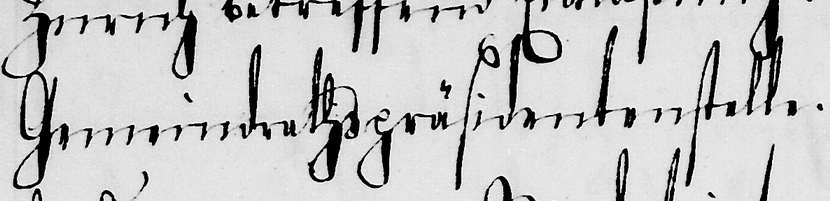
Gemeindrathspräsidentenstel¬
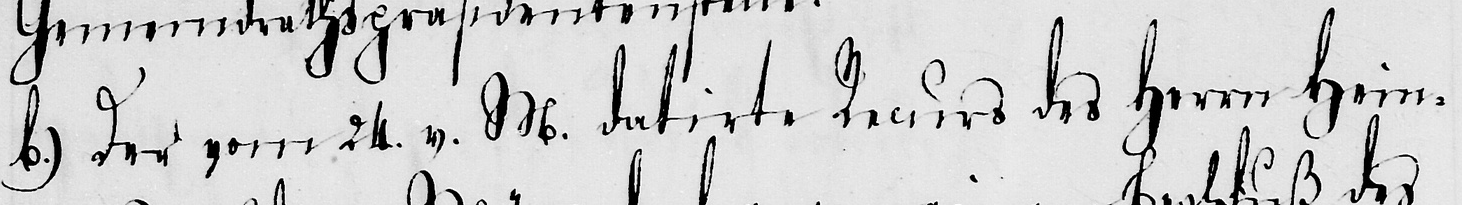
b.) Der vom 24. v. M. datirte Recurs des Herrn Hein¬
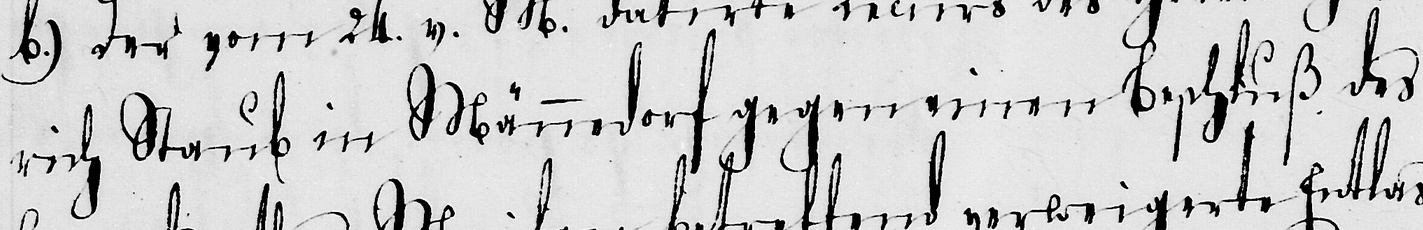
rich Staub in Männedorf gegen einen Beschluß des
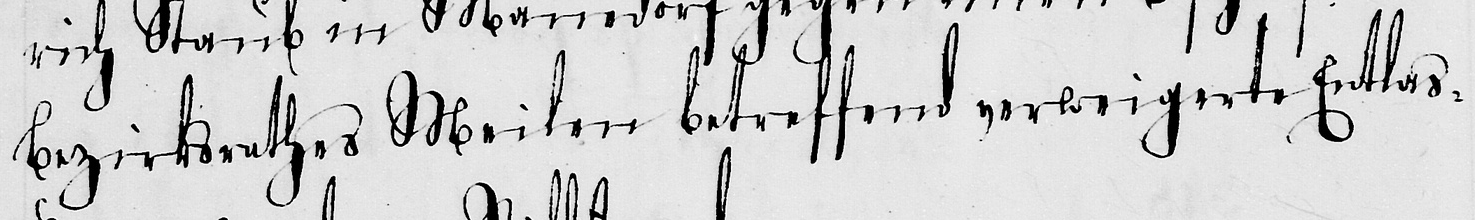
Bezirksrathes Meilen betreffend verweigerte Entlaß¬
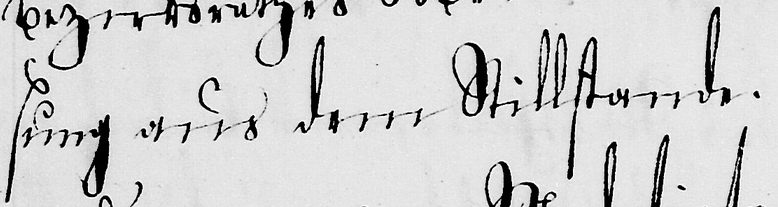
ung aus dem Stillstande.
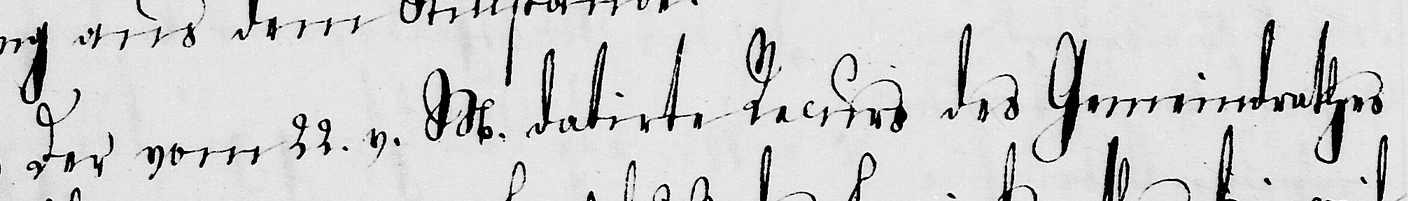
Der vom 22. v. M. datirte Recurs des Gemeindrathes
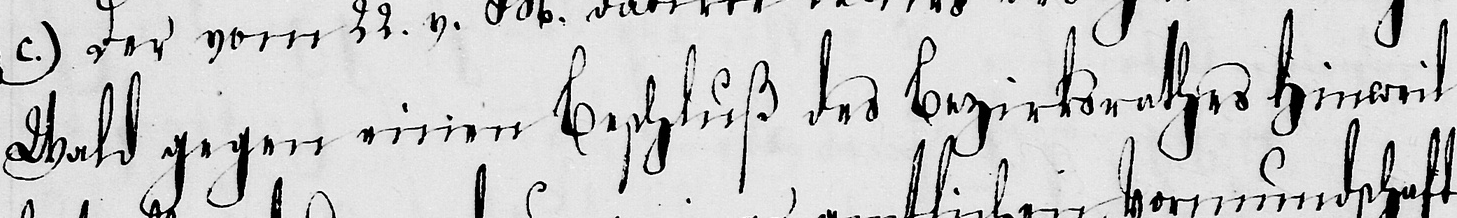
Wald gegen einen Beschluß des Bezirksrathes Hinweil
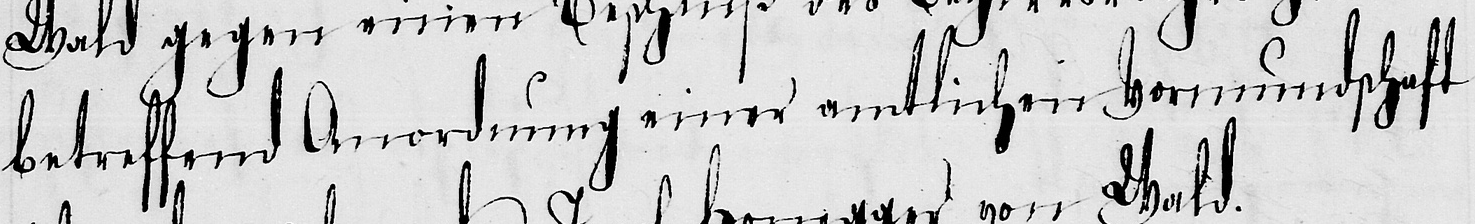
betreffend Anordnung einer amtlichen Vormundschaft
